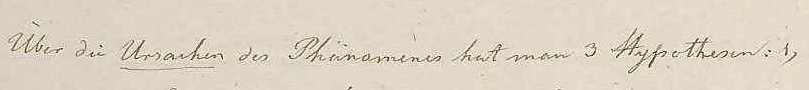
Über die Ursachen des Phänomenes hat man 3 Hypothesen: 1,
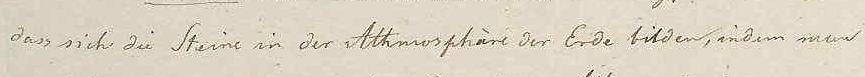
dass sich die Steine in der Athmosphäre der Erde bilden, indem man
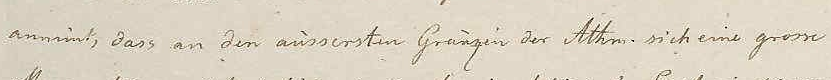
annimt, dass an den äussersten Gränzen der Athm. sich eine grosse
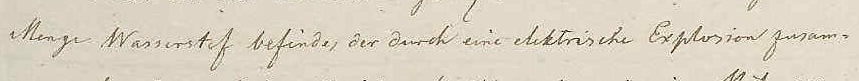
Menge Wasserstof befinde, der durch eine elektrische Explosion zusam-
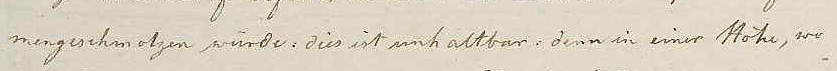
mengeschmolzen würde: dies ist unhaltbar: denn in einer Höhe, wo
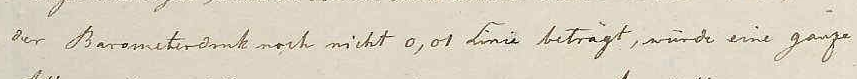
der Barometerdruk noch nicht 0,01 Linie beträgt, würde eine ganze
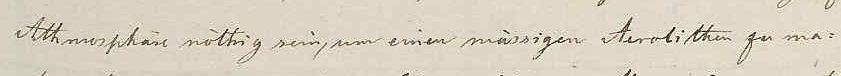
Athmosphäre nöthig sein, um einen Aerolithen zu ma-
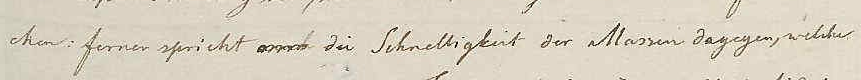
chen: ferner spricht auch die Schnelligkeit der Massen dagegen, welche
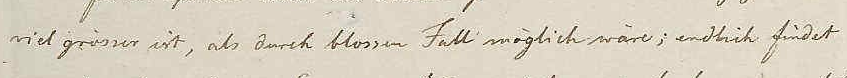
viel grösser ist, als durch blossen Fall möglich wäre; endlich findet
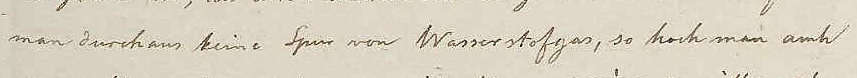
man durchaus keine Spur von Wasserstofgas, so hoch man auch
